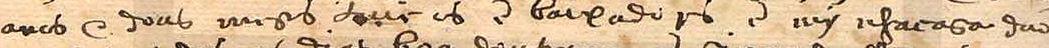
anos e dous meses tiue os ēbaixadores ē mynha casa daõ
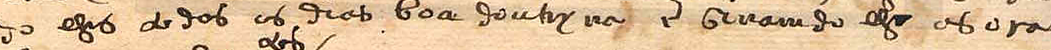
do lhes todos os dias boa doutryna ēsinamdo lhe as ora
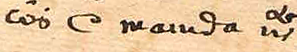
cōs e mamdamtos
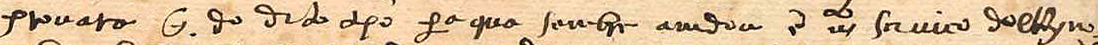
prouara q̄ do dito tpō ꝑa qua sembre amdou ē mto seruico del Rey no
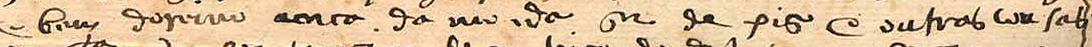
e bem do reino acerca da moeda ser de piso e outras cousas
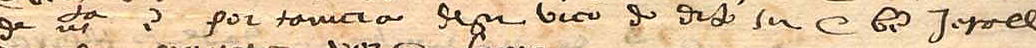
de mta ēportamcia de servico do dito sor e bē Jerall
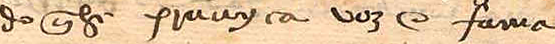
do q̄ he pruuyca voz e fama.
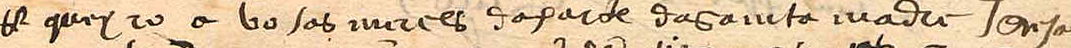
Requeyro a vosas merces da parte da samta madre JgreJa
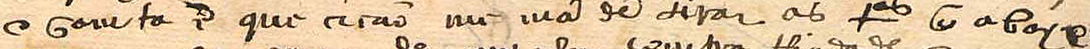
e samta ēquecicaõ me mādē tirar as tas q̄ abayxo
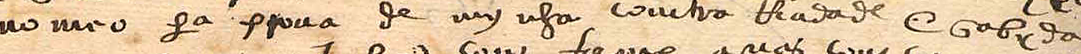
nomeo ꝑa proua de mynha comtraRiadade e sabyda
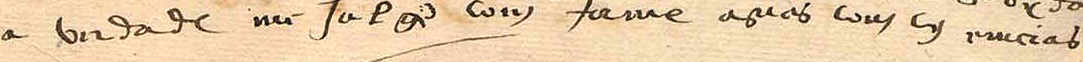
a verdade me Julgē comforme a suas comcyemcias
